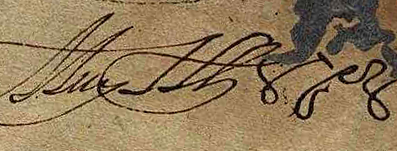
Mto Illes Sres
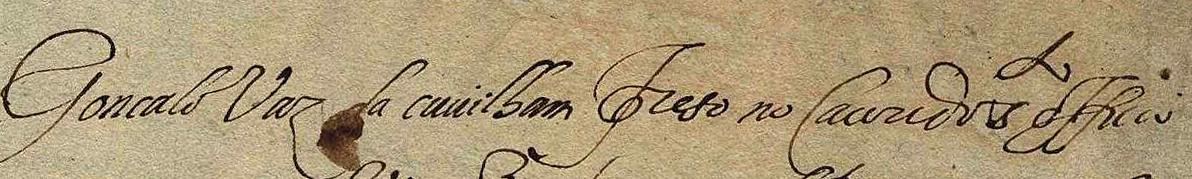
Gonçalo Vaz da cuuilham preso no Cacere do sto officio
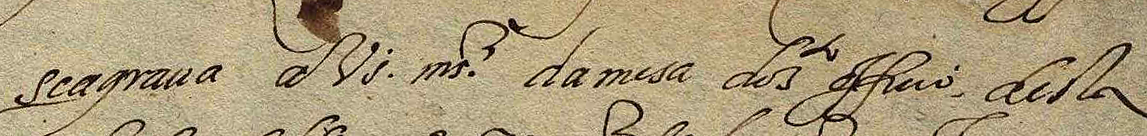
se agraua a Vs. ms̄. da mesa do sto officio desta
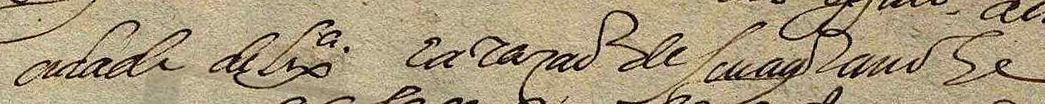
cidade de lixa E a razaõ de seu agrauo he
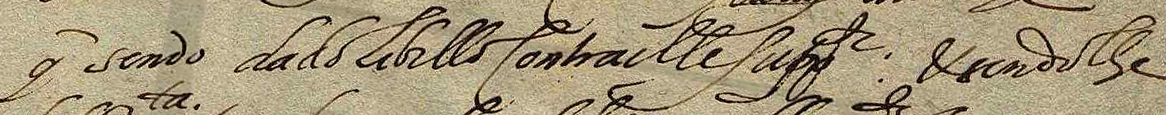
q̄ sendo dado libello Contra elle Suppte : & sendo lhe
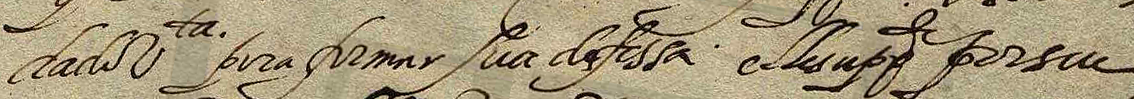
dado Vta. pera formar sua defessa elle suppte por seu
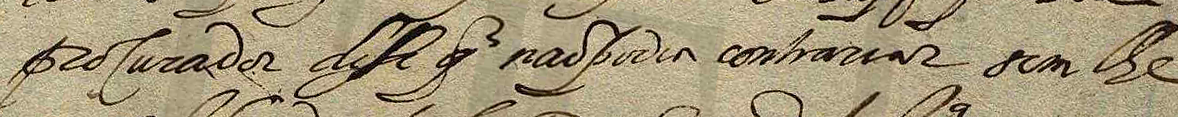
proCurador disse q̄ naõ podia contrariar sem lhe
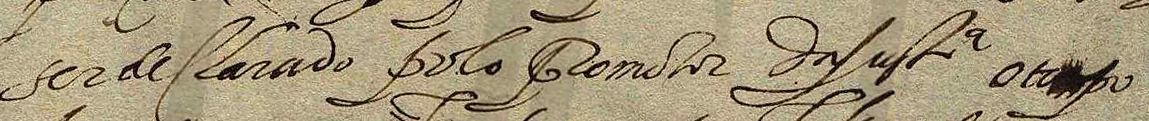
ser deClarado polo promotor da Justa o tempo
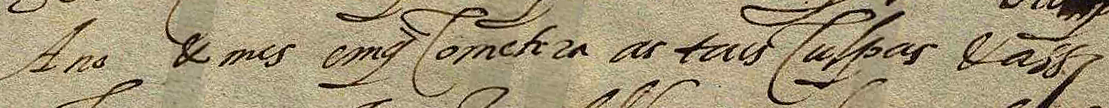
Ano & mes em q̄ Cometera as tais Culpas & assj
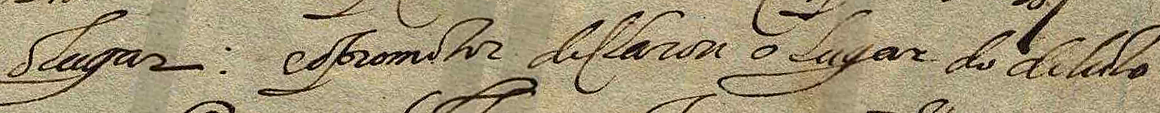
o lugar : e o promotor deClarou o lugar do delicto
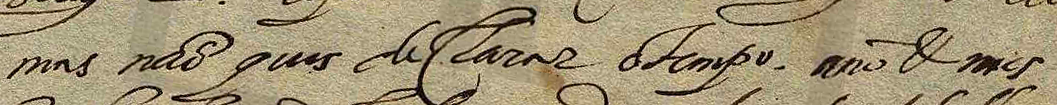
mas naõ quis deClarar o tempo an̄o & mes
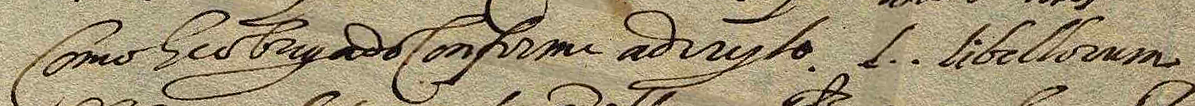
Como he obrigado Conforme a direjto. l. libellorum
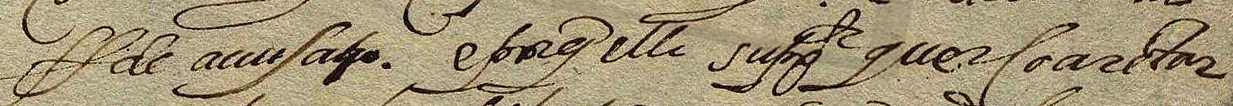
§ de accusatjo. e porq̄ elle suppte quer Coarctar
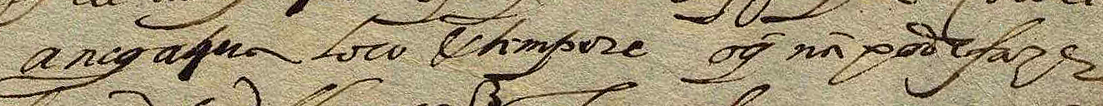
a negatjua loco & tempore o q̄ nā pode fazer
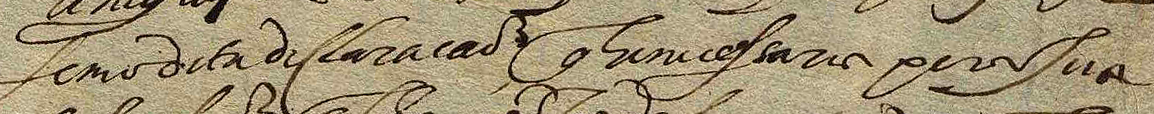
sem o dita deClaraçaõ q̄ he necessaria pera sua
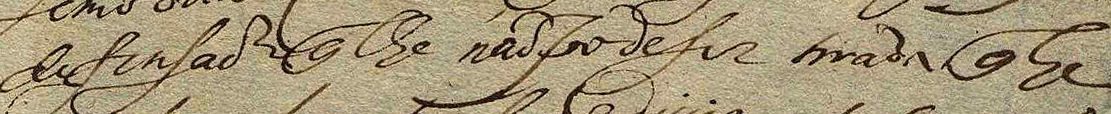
defensaõ q̄ lhe naõ pode ser tirada q̄ he
